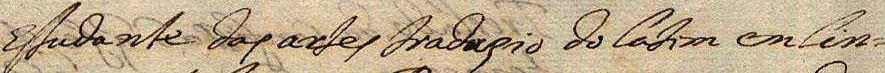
Estudante das artes traduzio do latim em lin
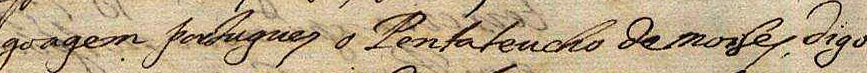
goagem portuguez o Pentateucho de moises, digo
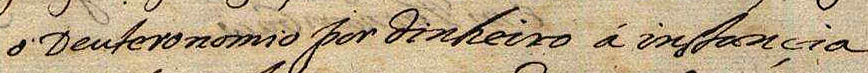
o Deuteronomio por dinheiro á instançia
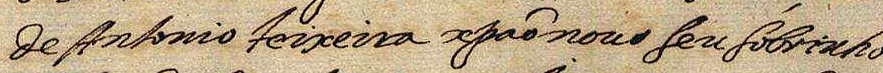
de Antonio teixeira xpaõ nouo seu sobrinho
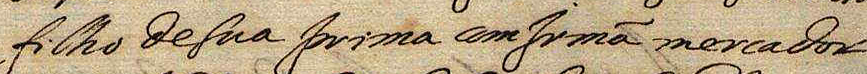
filho de sua prima comJrmã mercador
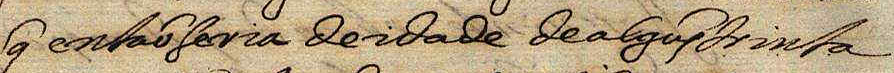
q̄ entaõ seria de idade de algus̄ trinta
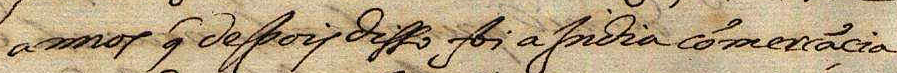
annos q̄ despois disso foi a Jndia cō mercāçia
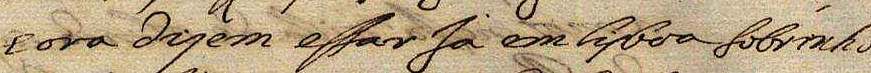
E ora dizem estar Ja em lisboa sobrinho
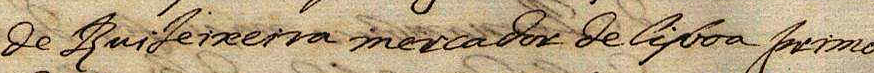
de Rui teixeira mercador de lisboa primo
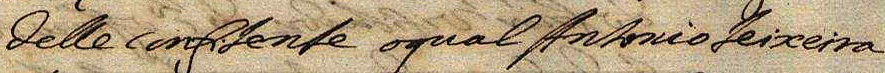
delle confidente o qual Antonio teixeira
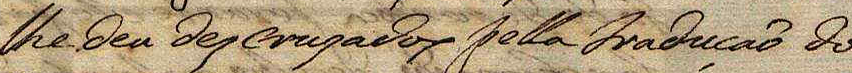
lhe deu dez cruzados pella traduçaõ do
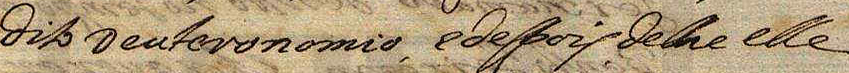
dito Deuteronomio, E despois de lhe elle
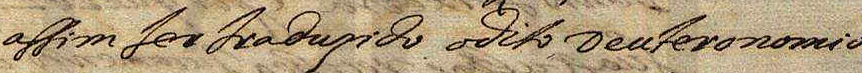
assim ter traduzido o dito Deuteronomio
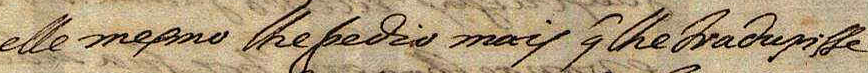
elle mesmo lhe pedio mais q̄ lhe traduzisse
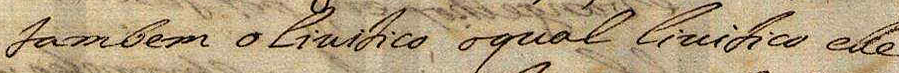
também o Liuitico o qual liuitico elle
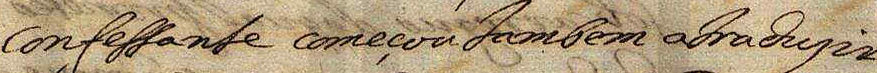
confessante começou tambem a traduzir
